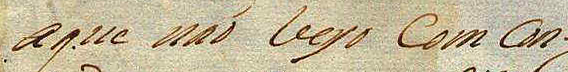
a que naõ veyo com con
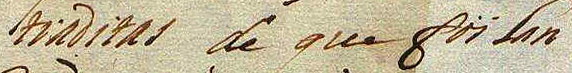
traditas de que foi Lan
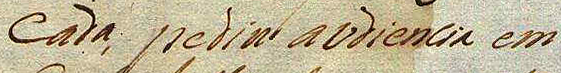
cada, pediu avdiencia em
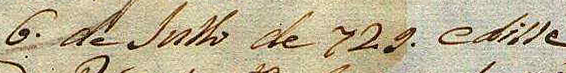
6. de Iulho de 729. e disse
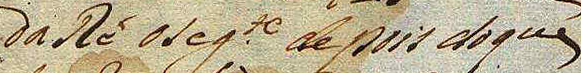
da Ré o seg.te depois do que
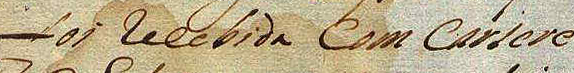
foi Recebida com carsere
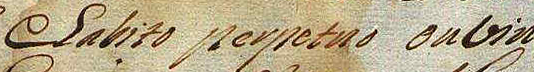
e habito perpetuo ouviu
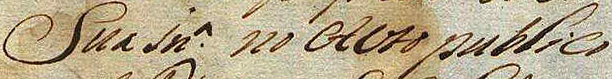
Sua sn.a no Avto publico
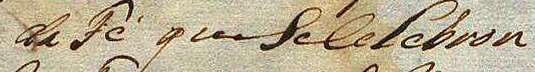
da Fé que se Celebrou
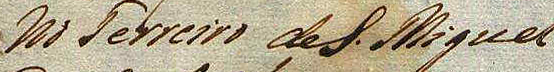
no Terreiro de S. Miguel
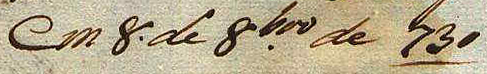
em 8. de 8.bro de 730.
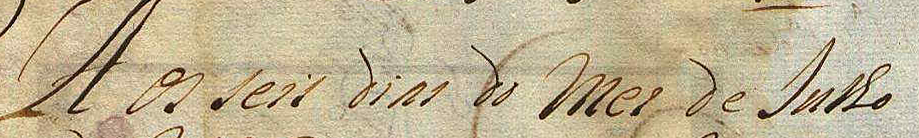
Aos seis dias do Mes de Iulho
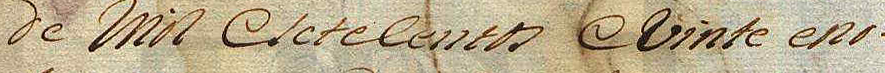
de Mil e setecentos e vinte e no
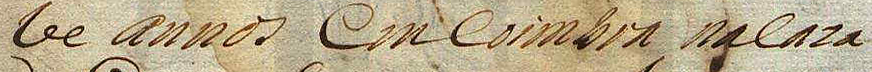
ve annos em coimbra na caza
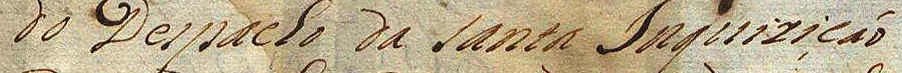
do Despacho da santa Inquiziçaõ
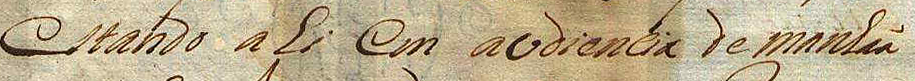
estando ahi em avdiencia de manhaã
